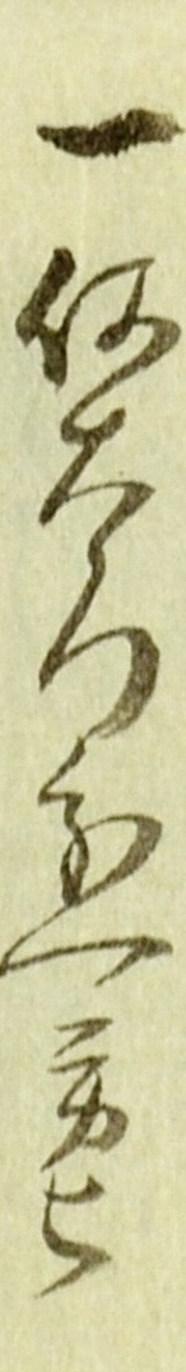一何右衛門分一方被
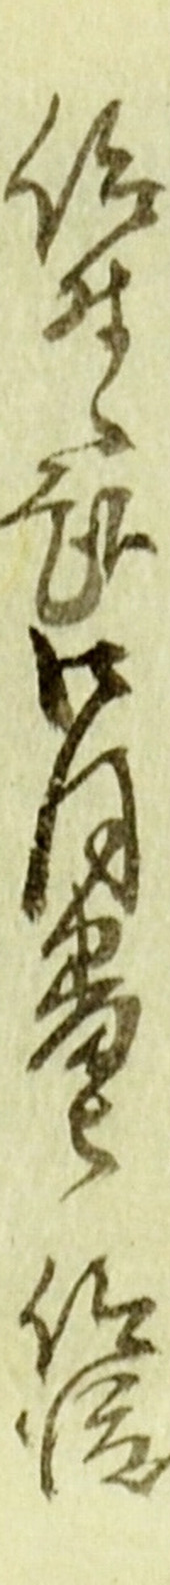仰付候趣御月番被仰渡
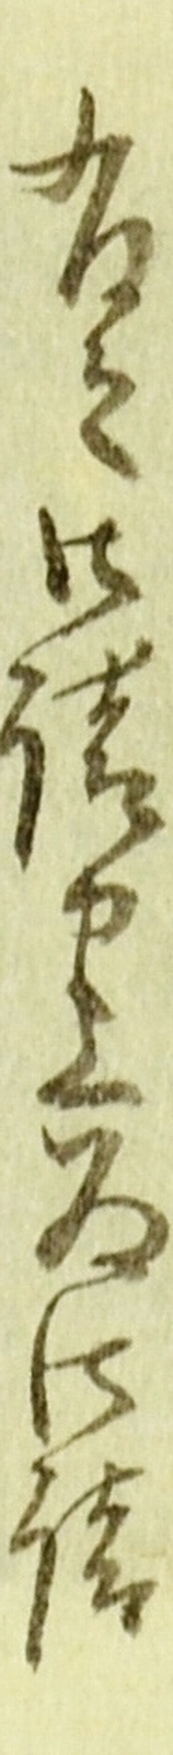有之御請申上為御請
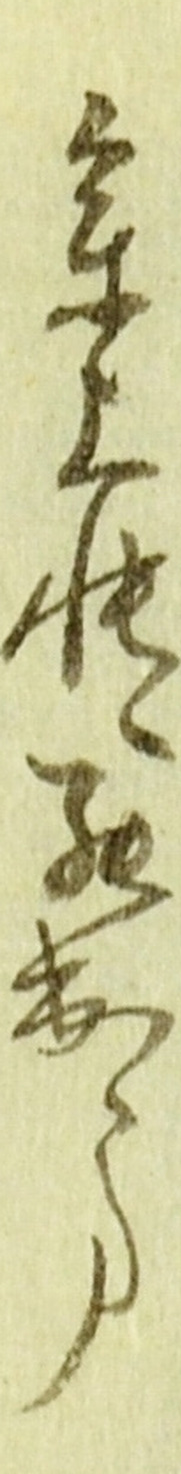参上帳候罷出候事
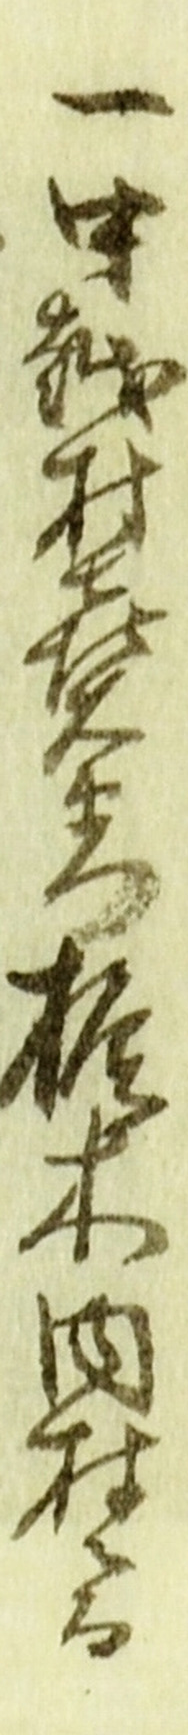一中越村喜右衛門梶本内村ニ而
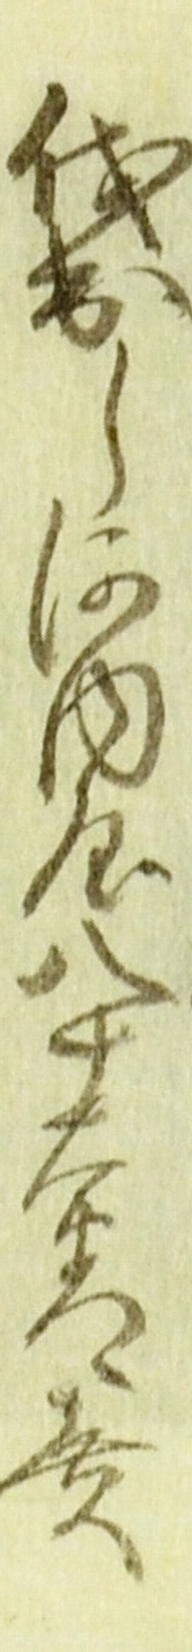伐出事河内屋八十右衛門へ売
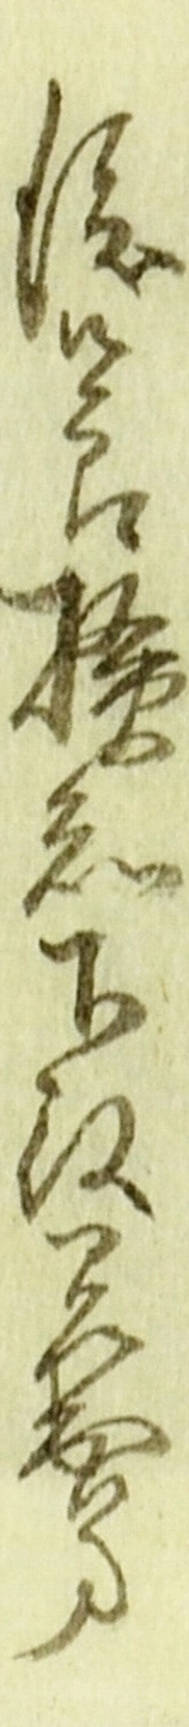渡候節検知下役差出候方
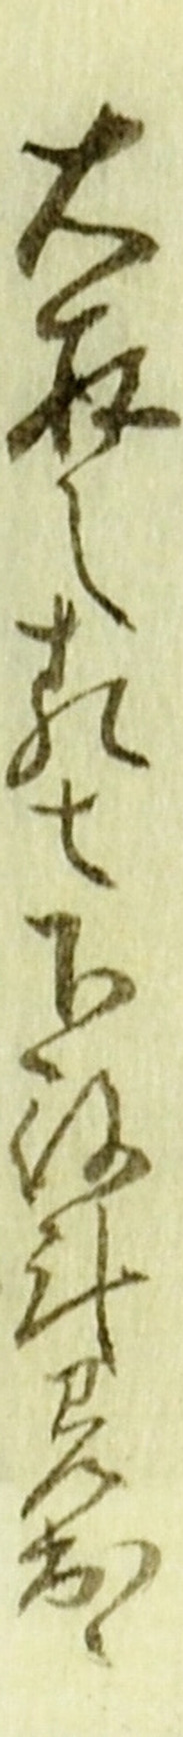右存之類者下役斗差出候
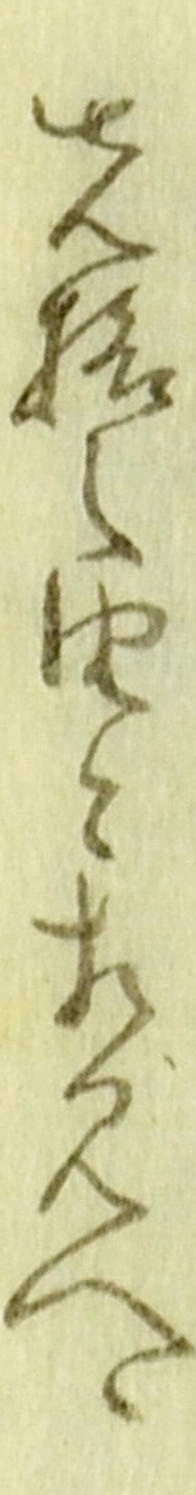先拾之由と相見へ候
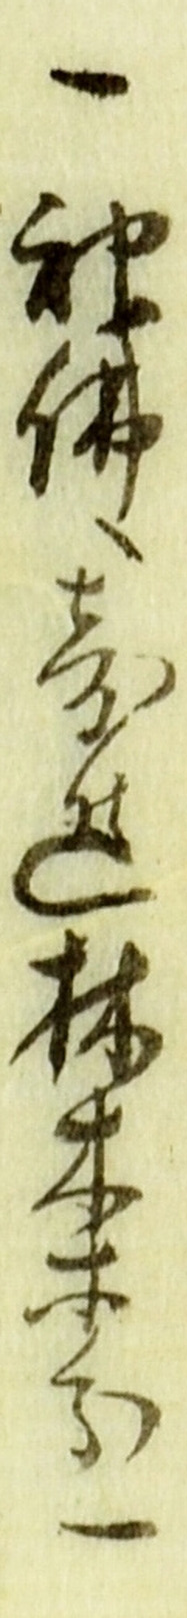一神仏へ寄進林木等分一
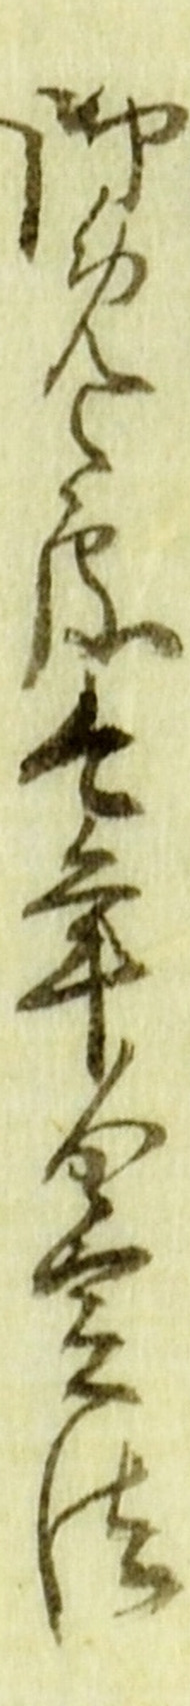御免之処今年ゟ定法
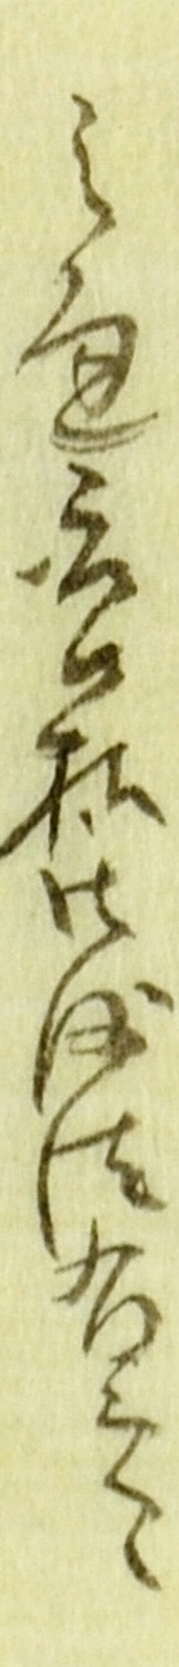之通取候様御沙汰有之候
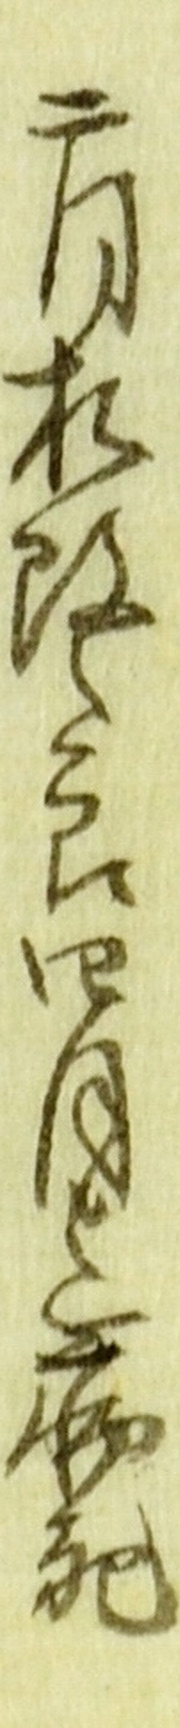二月相改之節四月迄病死
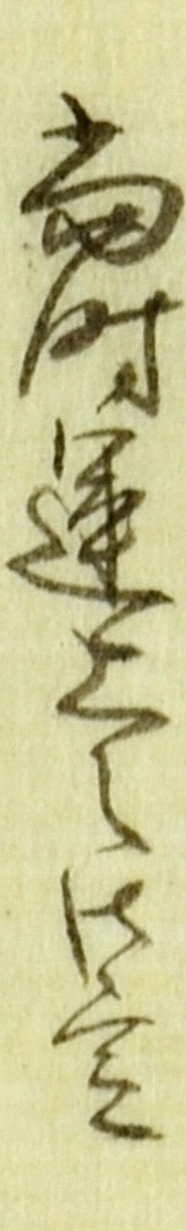当時運上之御定
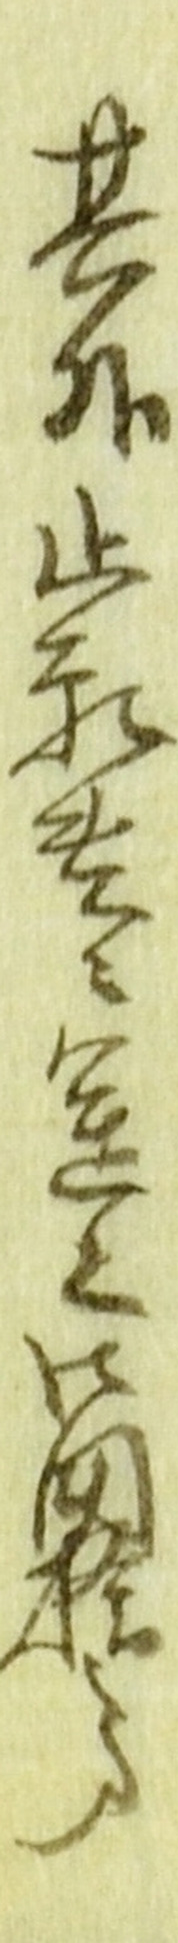其外止願共ニ運上御用捨之事
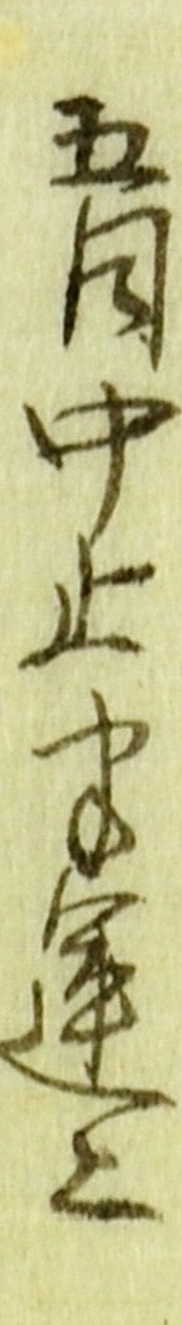五月中止半運上
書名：分一御定法
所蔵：伊那市立高遠町図書館・合同会社AMANE
